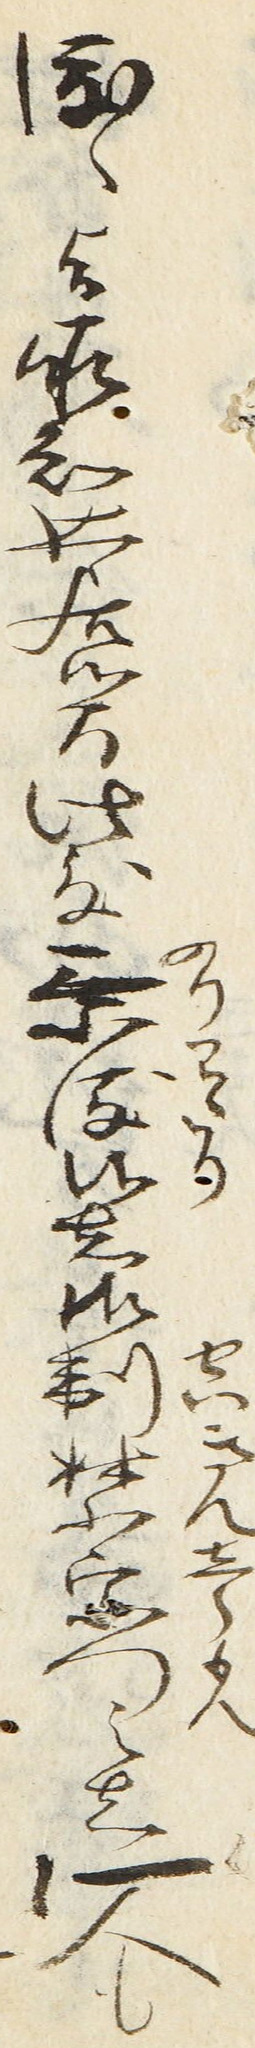渡候旨承知仕居候間此度乗渡候者御制禁宗門之者一人も
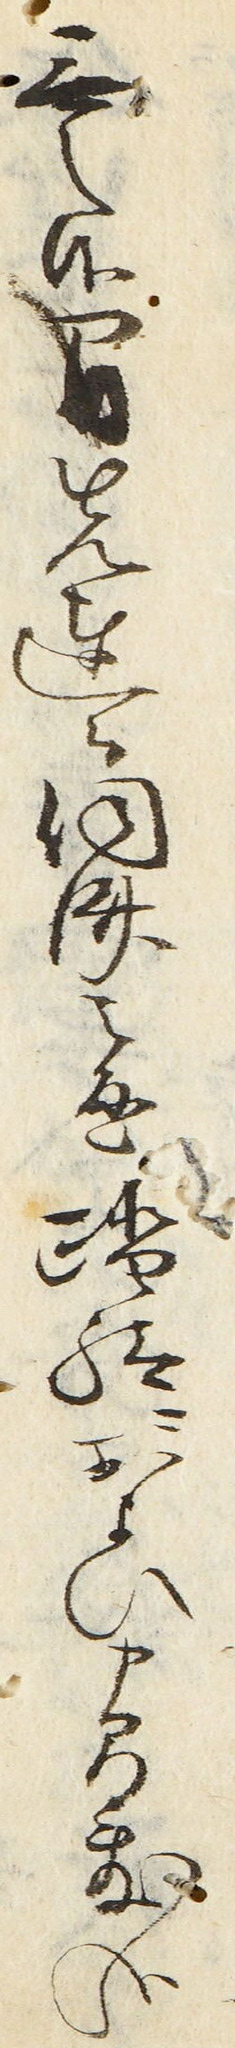無之候間先達て伺済之通踏絵におよひ申間敷哉

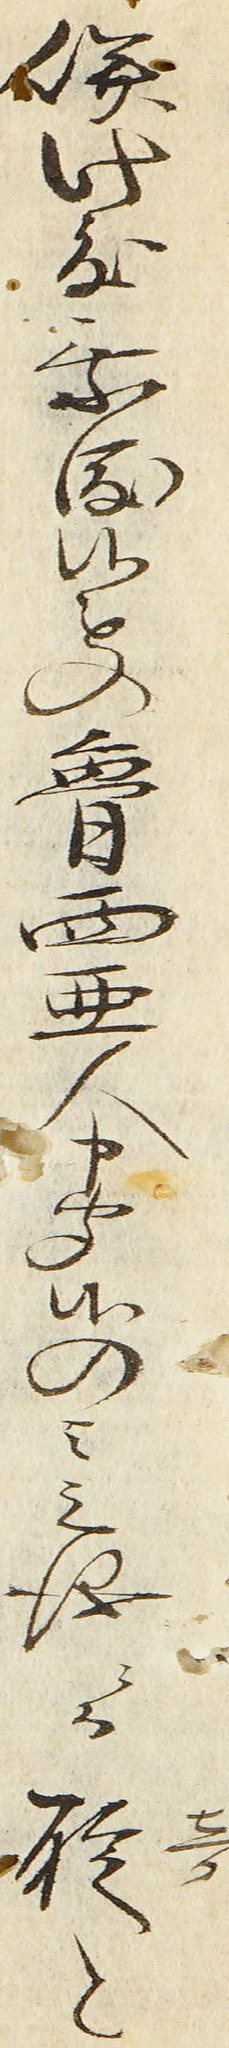併此度乗渡候もの魯西亜人申聞候のみ之儀にて聢と
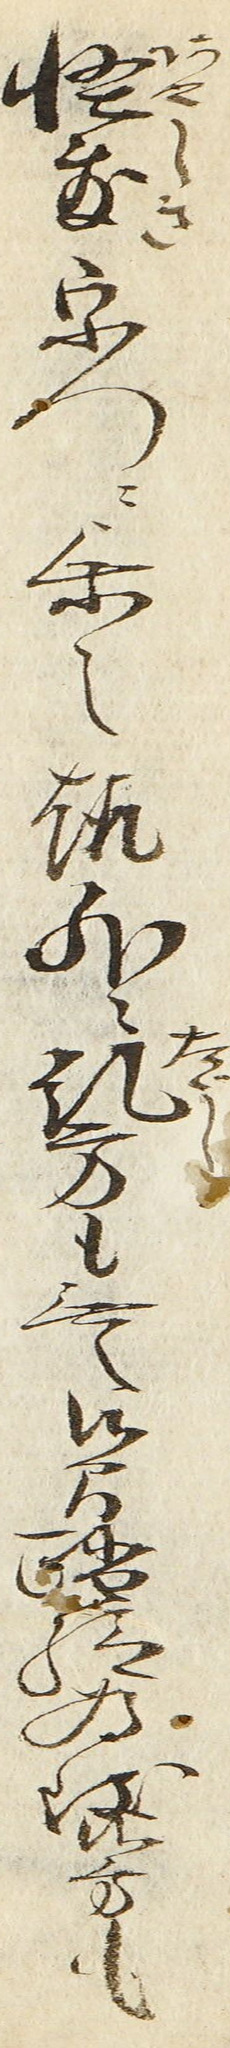怪敷宗門に無之趣外に糺方も無之候間踏絵為致候方も
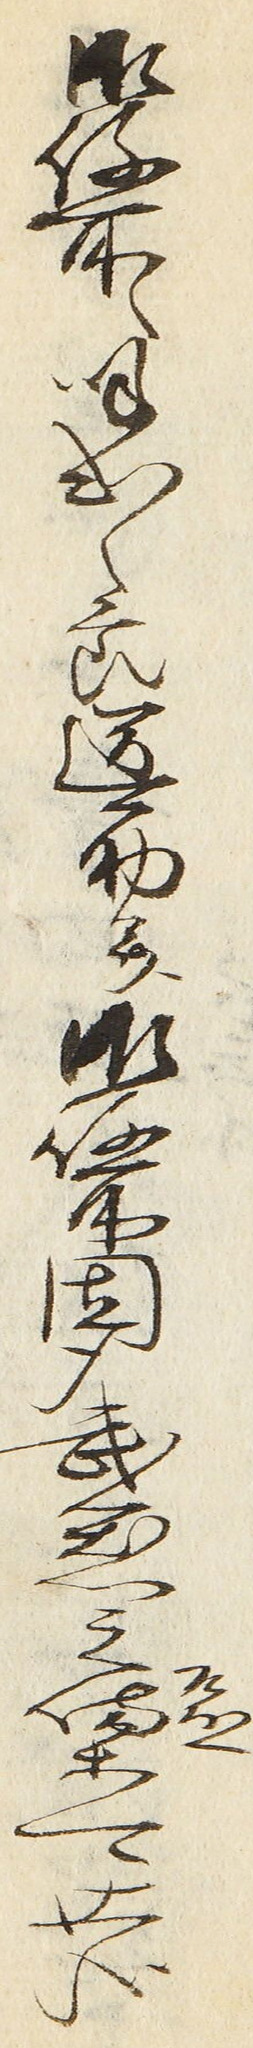御役所へ呼出之節道筋幷御役所固め武器之備等可仕哉
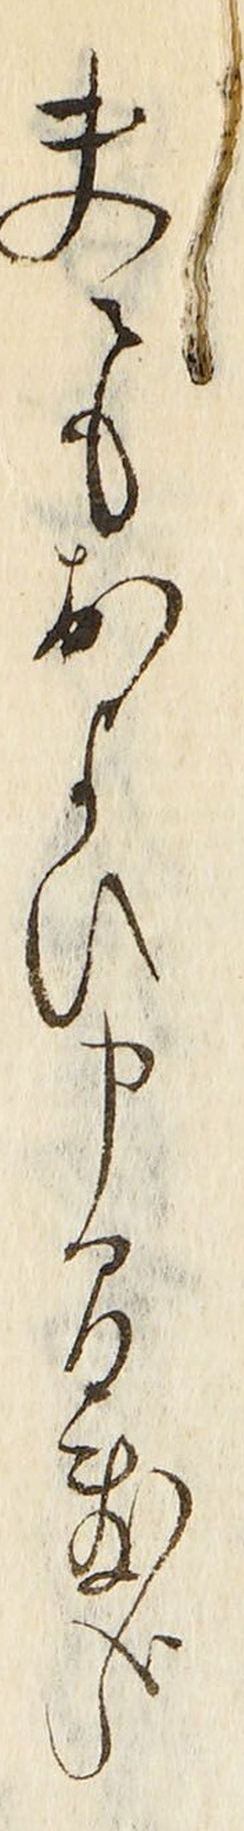夫にもおよひ申間敷哉
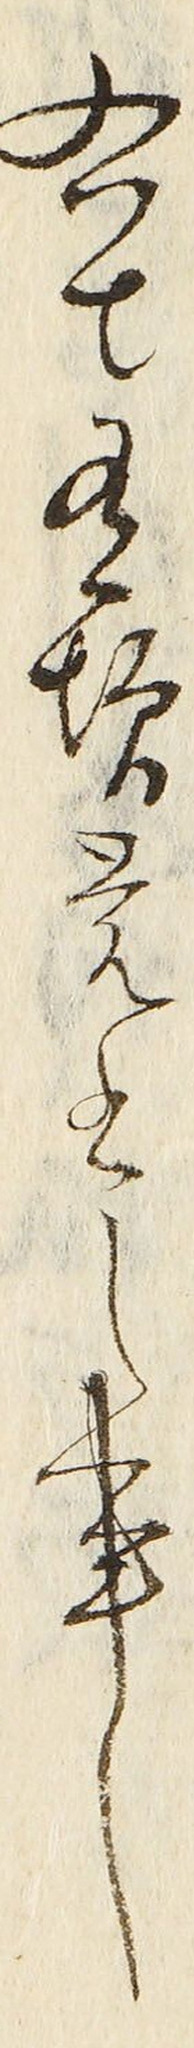右は有増覚書之事
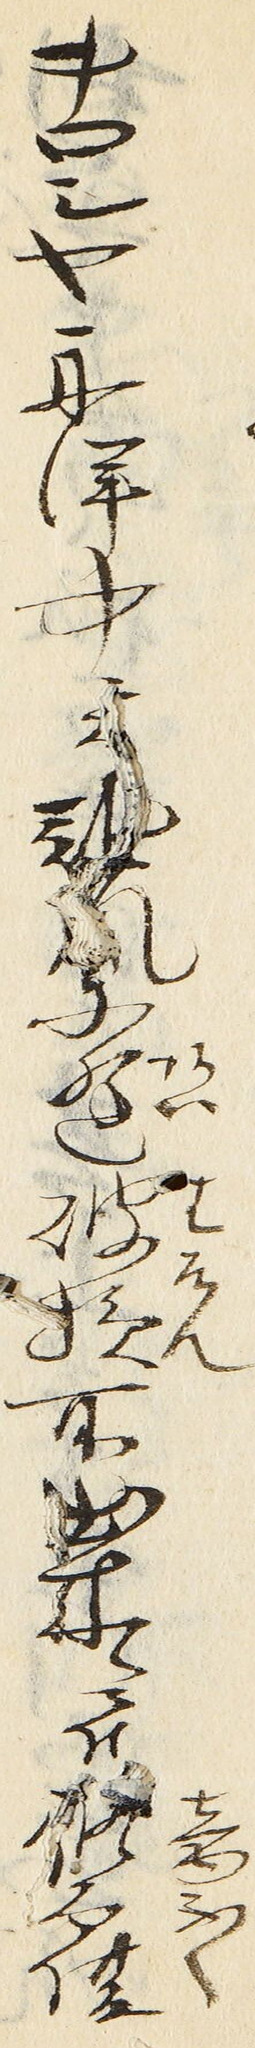ヲロシア舟洋中にて難風に逢破損所出来候に付修覆
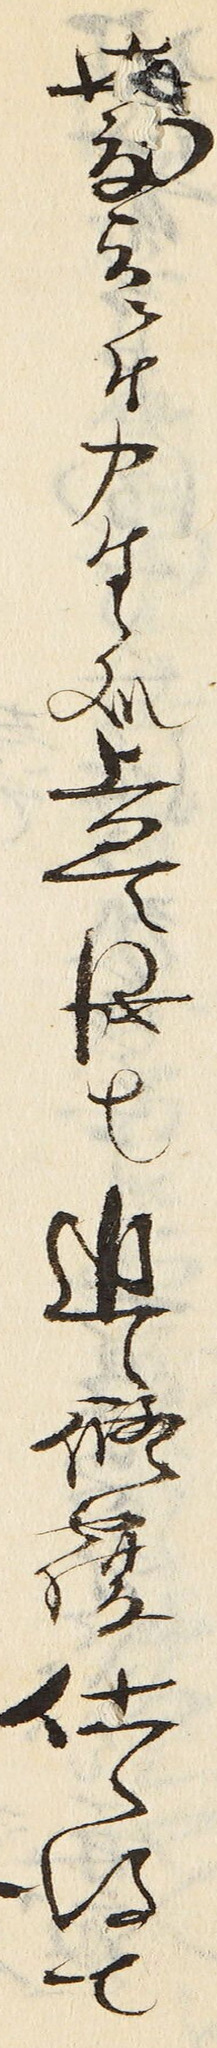仕度旨に付申付候処上廻候儀は追々修覆仕候得は
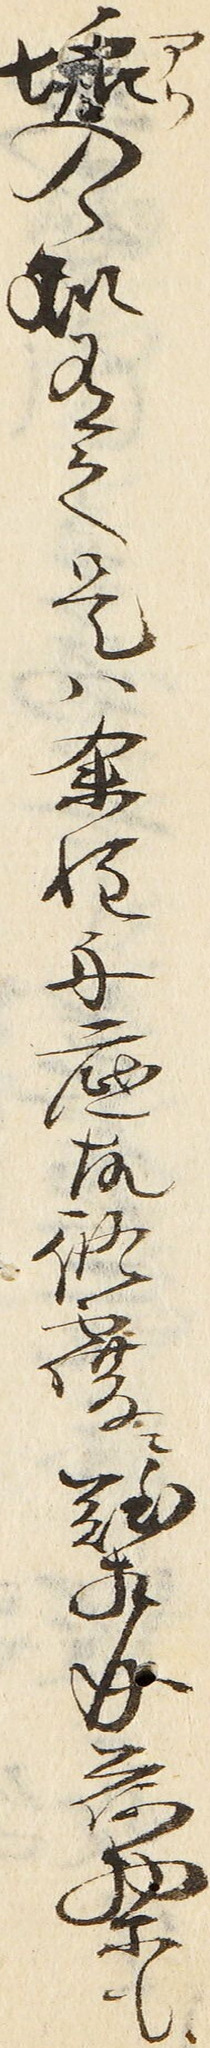垢入候処有之是は余程舟底故修覆に難相成荷物等も
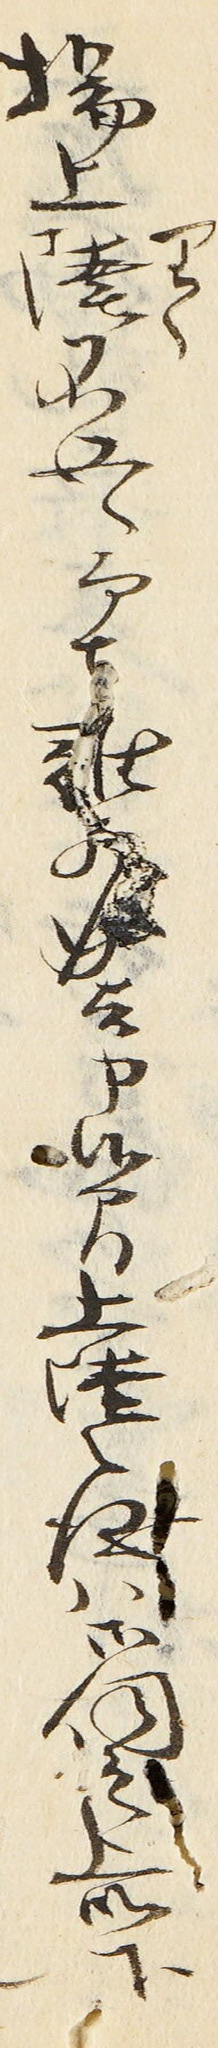揚上陸不仕候ては難相成旨申候間上陸之儀は御伺之上御下
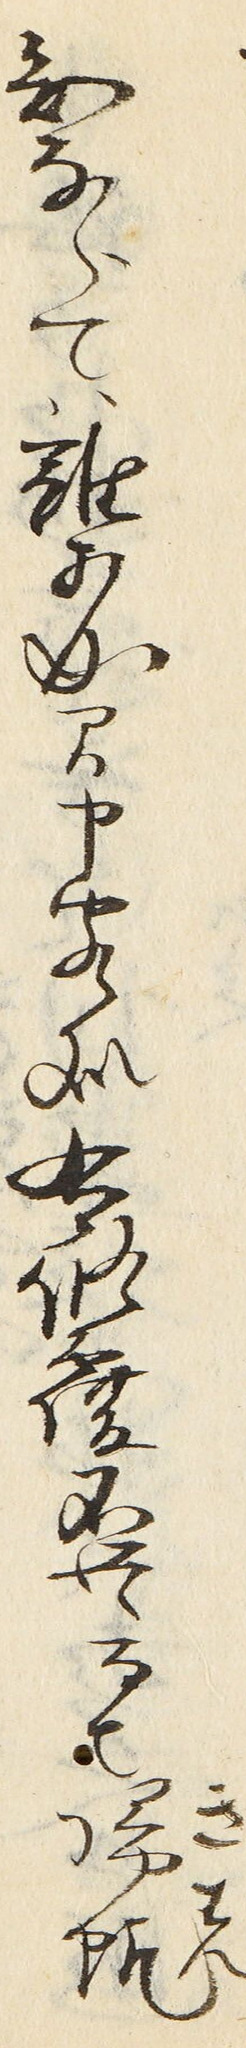知ならては難相成間申聞候処右修覆不仕候ては帰帆
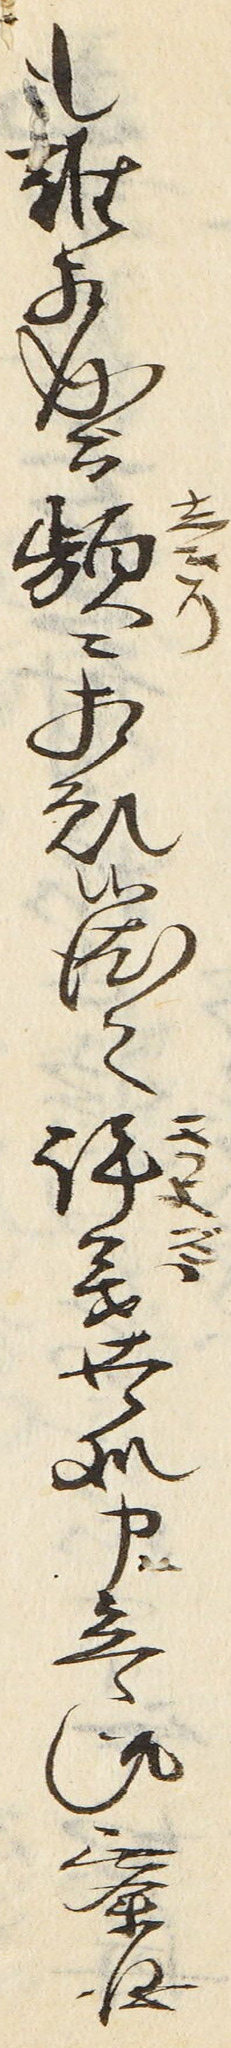も難相成旨頻に相願候依之評義仕候処申立候趣無余儀
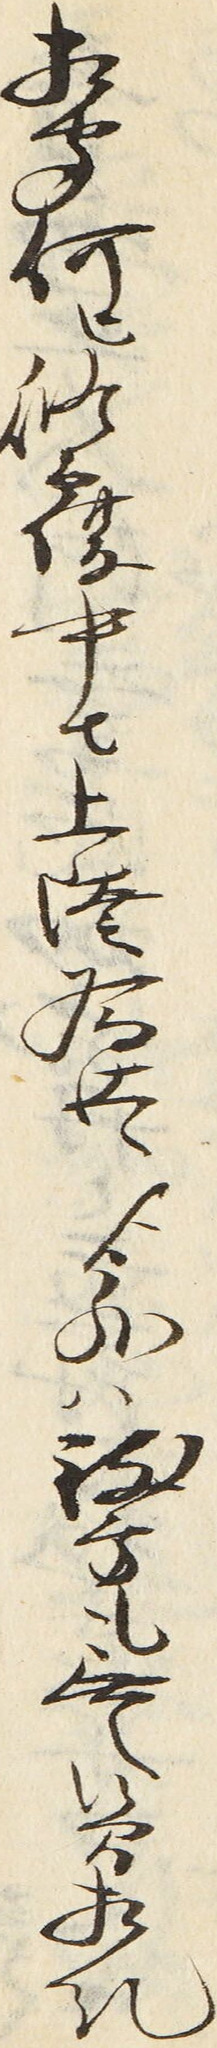相聞何れ修覆中は上陸為仕候より外は致方も無之候間相糺
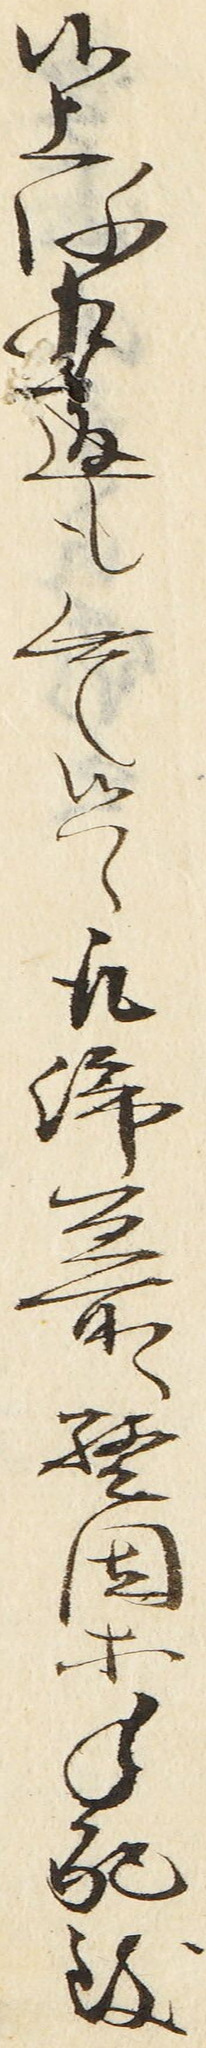候上弥相違も無之候はゝ取締宜所へ警固等手配致
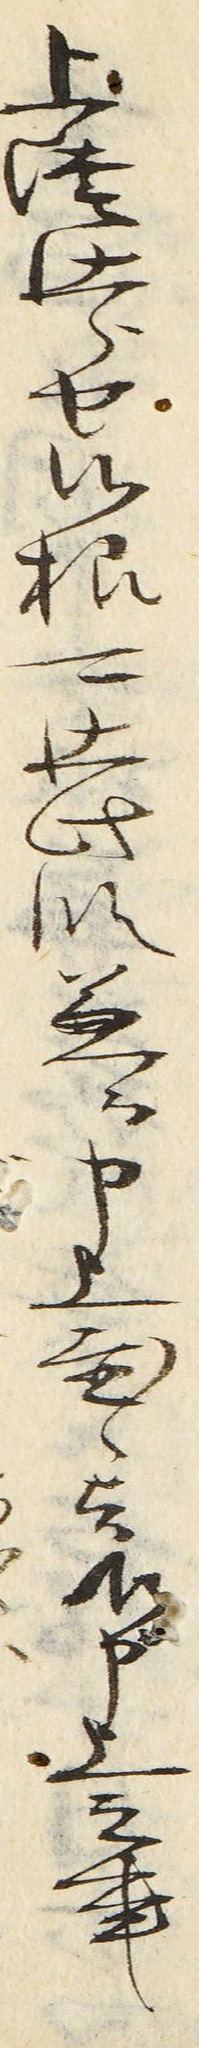上陸仕らせ候様可仕此段兼て申上置候旨御申上之事
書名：魯西亜国舟渡来始末并日本流漂人異国遍歴之話（西洋欧羅巴州之内一）
